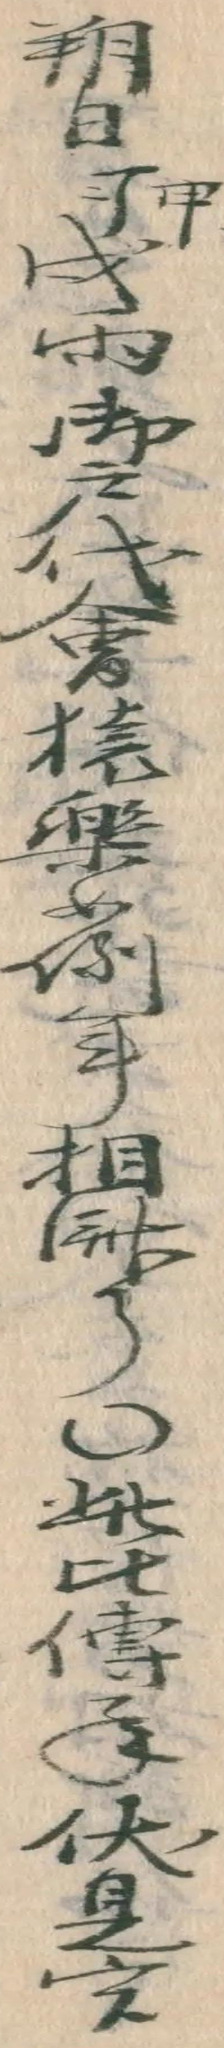朔日甲戌雨御戸代会猿楽如例年相済了◯此比傳承伏見宮
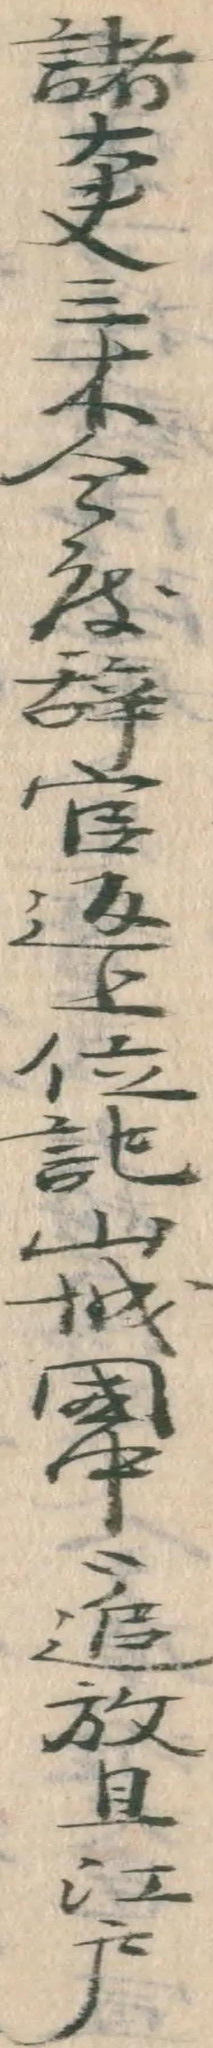諸大夫三木今度辞官返上位記山城国中御追放且江戸
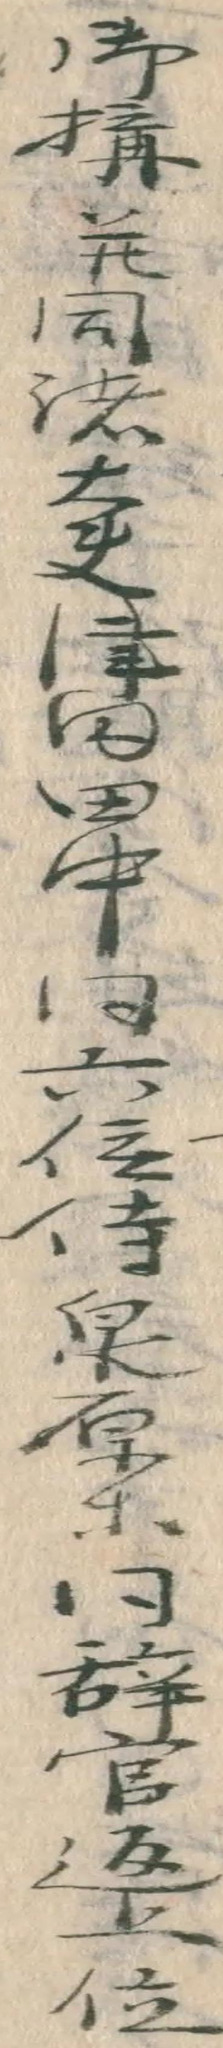御構并同諸大夫津田田中同六位侍泉原等同辞官返上位
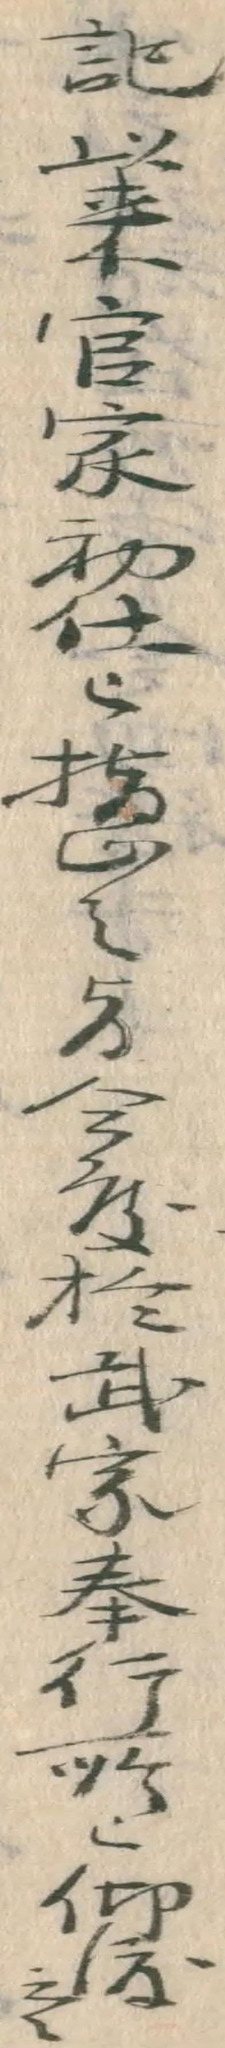記以来官家初仕候指出之旨今度於武家奉行所被仰渡之事
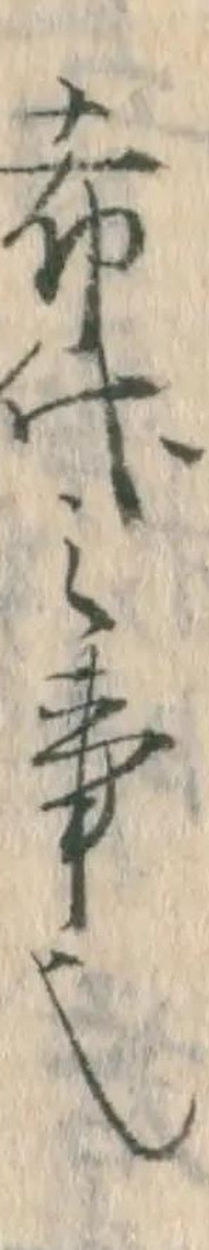希代之事也
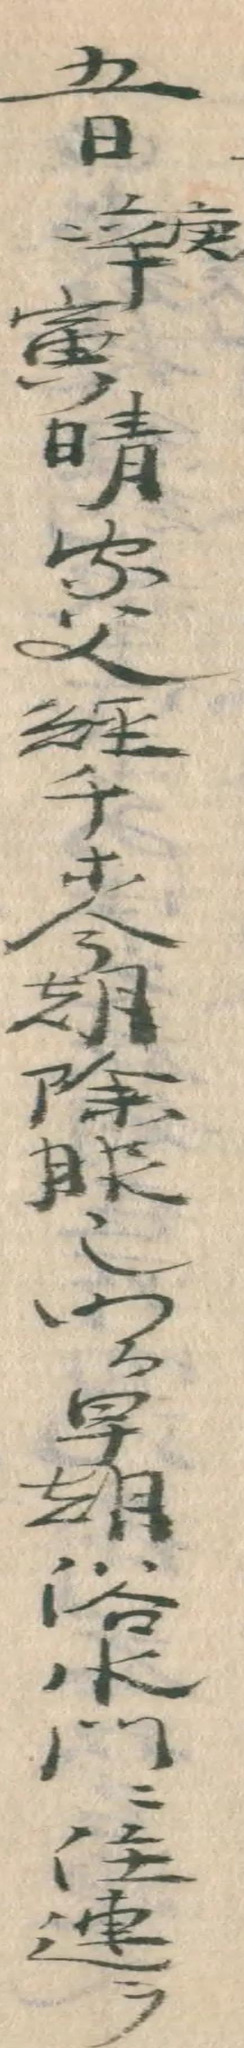五日庚寅晴家父經千等今朝除服也仍而早朝浴水門ニ注連ヲ
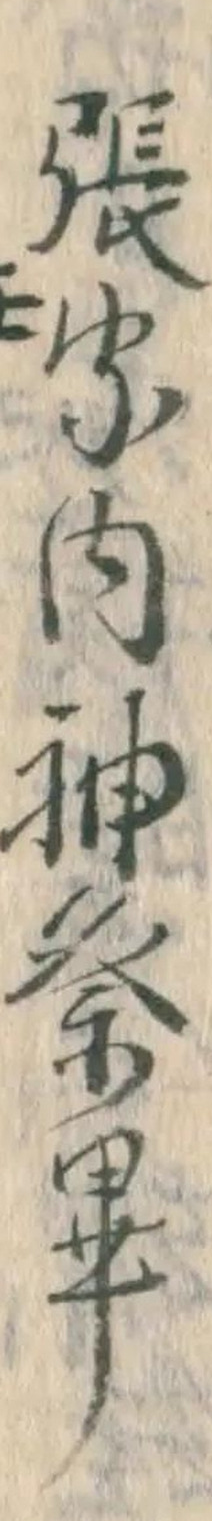張家内神祭畢
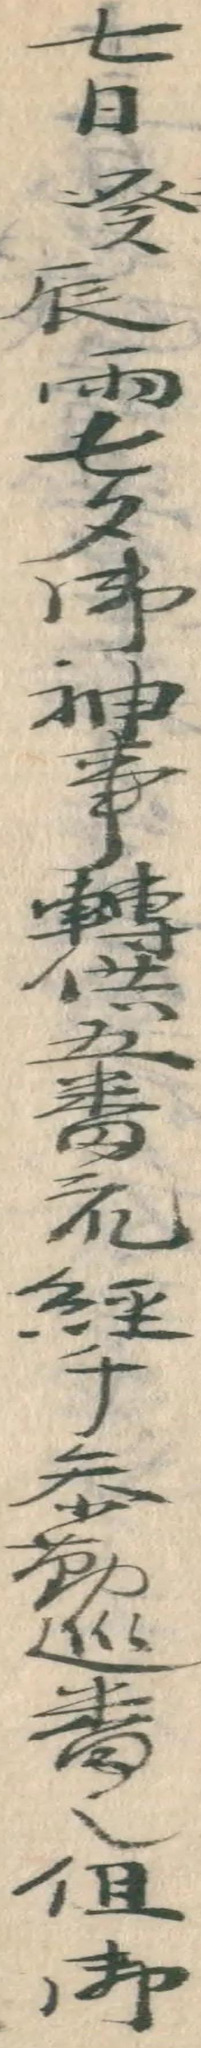七日壬辰雨七夕御神事轉供五番衆経十参勤巡番也但御
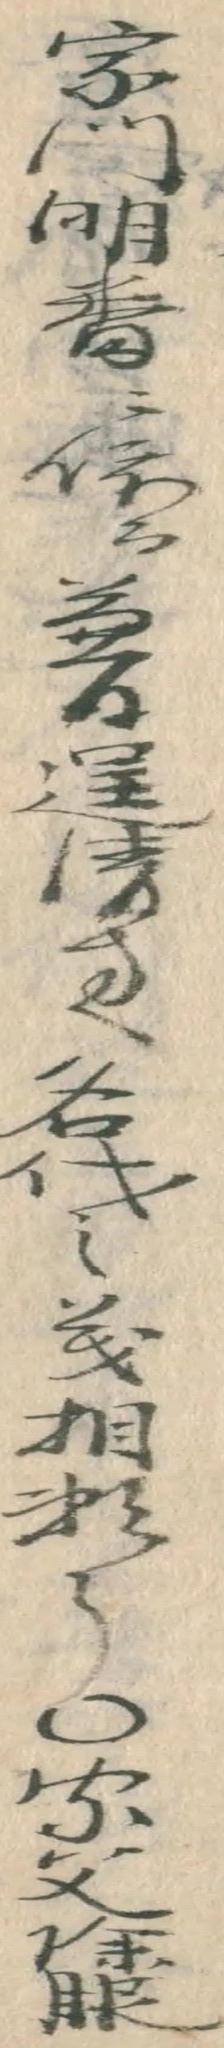家門明番ニ依而兼日逞清方へ名代之義相頼了○家父除服
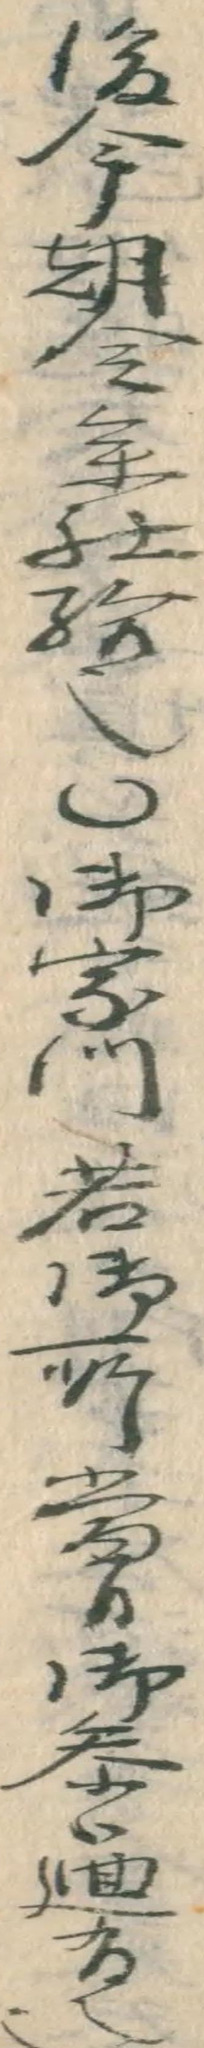後今朝令参社給也○御家門若御所當日御参御廻有之也

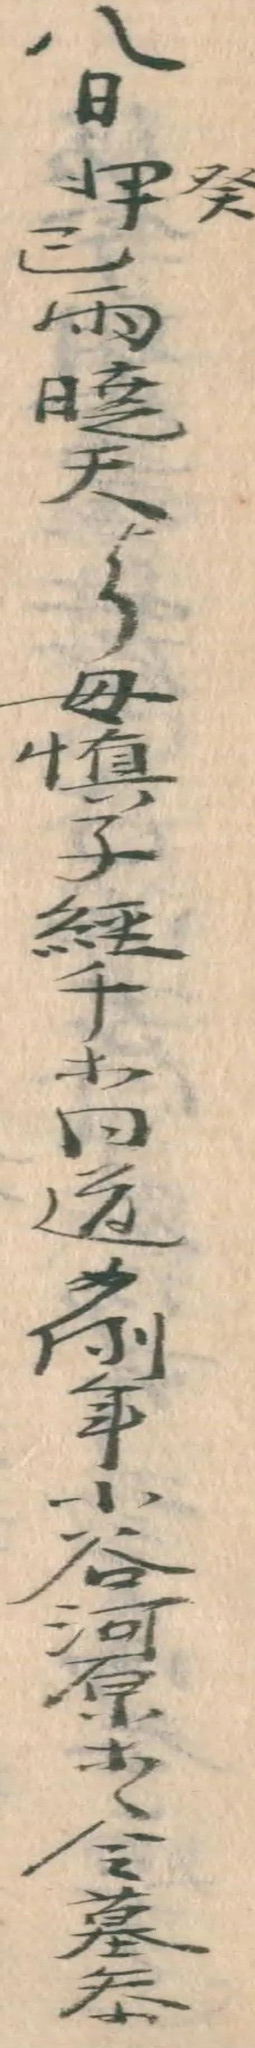八日巳雨暁天より母慎子経十等同道如例年小谷河原等へ令墓参
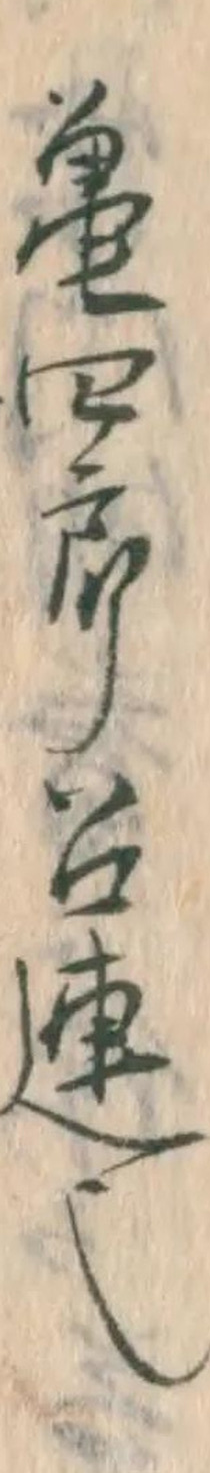亀四郎召連也
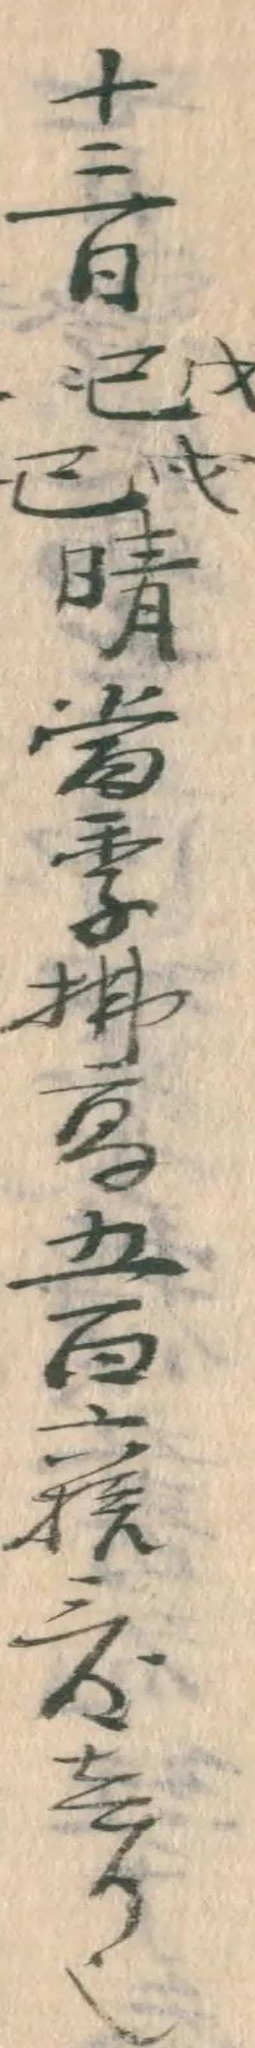十三日戊戌晴當季払高五百六拾三匁壱分也
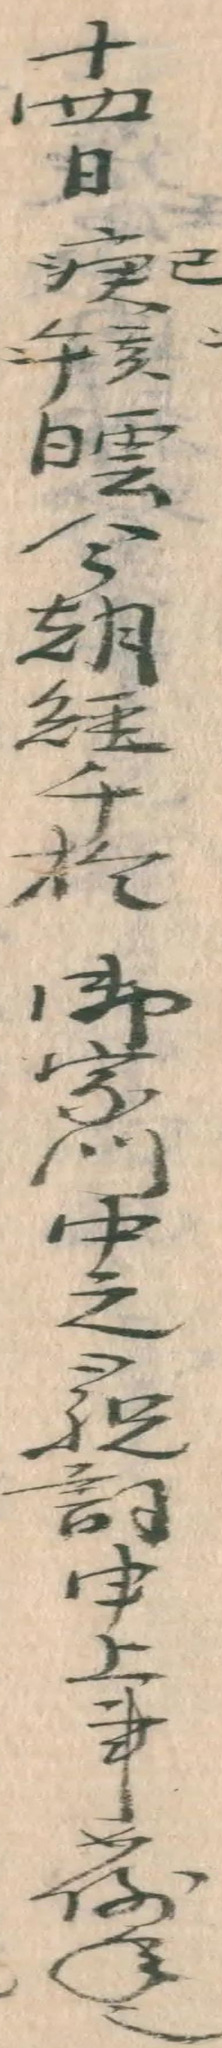十四日己亥曇今朝経千於御家門中之御祝詞申上事如例年也
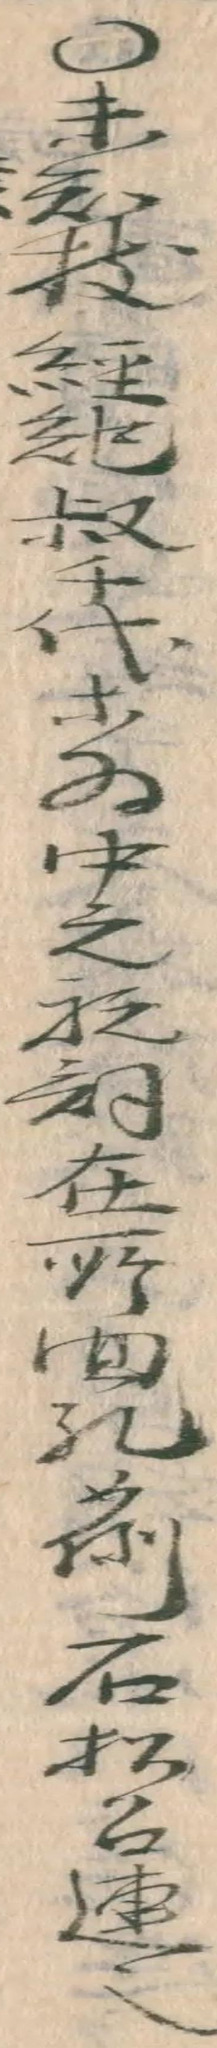○未知枝経矩叔千代等為中之祝詞在所回礼如例石松召連也
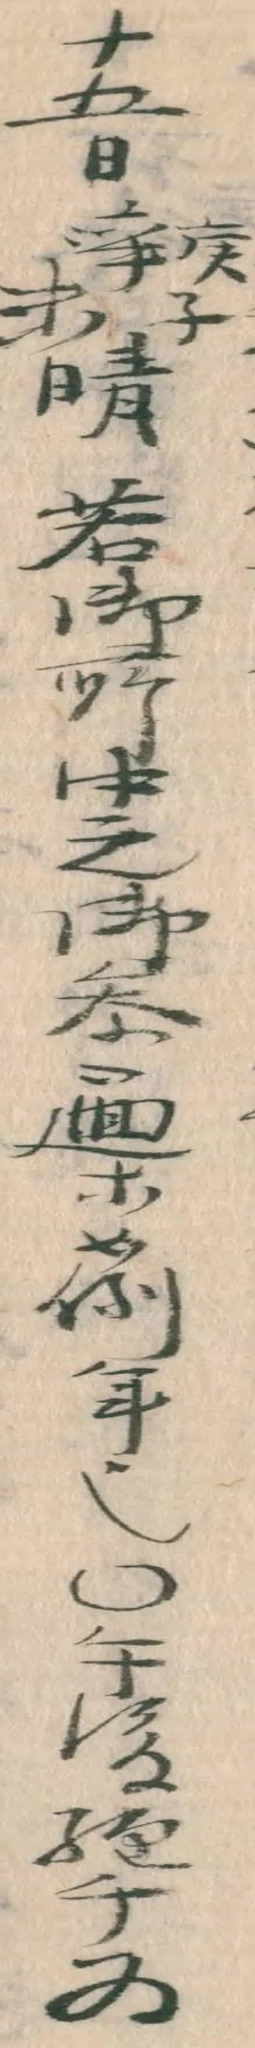十五日庚子晴若御所中之御参御廻等如例年也○午後経午為
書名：賀茂社記録. 第65冊
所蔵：国立国会図書館 National Diet Library, JAPAN
